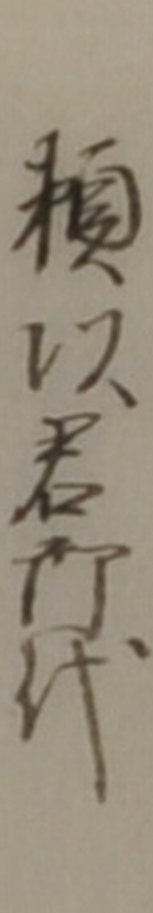頼以君御代
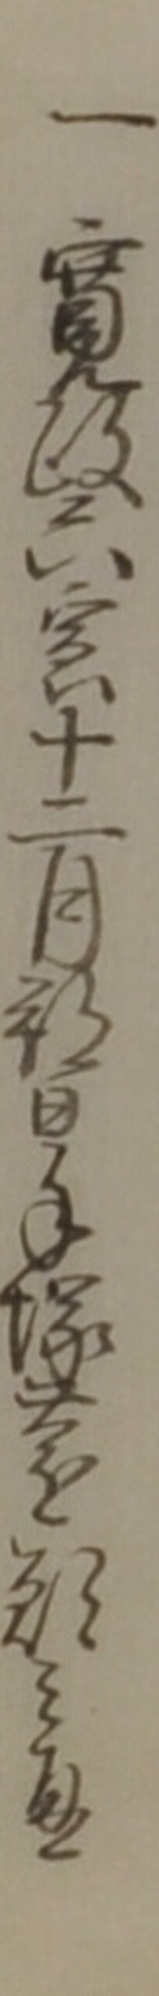一寛政六寅十二月朔日手塚薗願之通
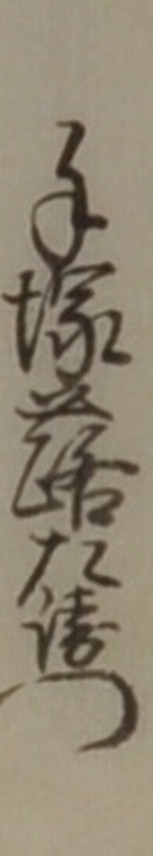手塚蕗左衛門
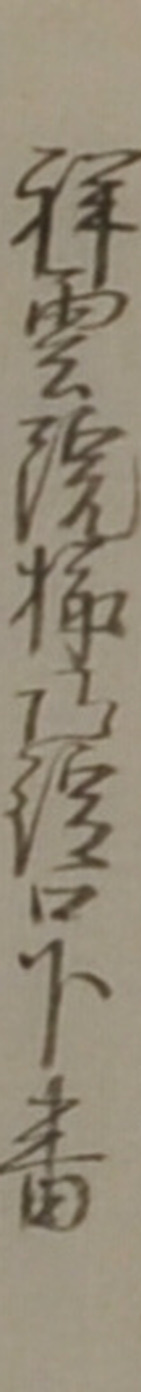祥雲院様仰出御錠口下番
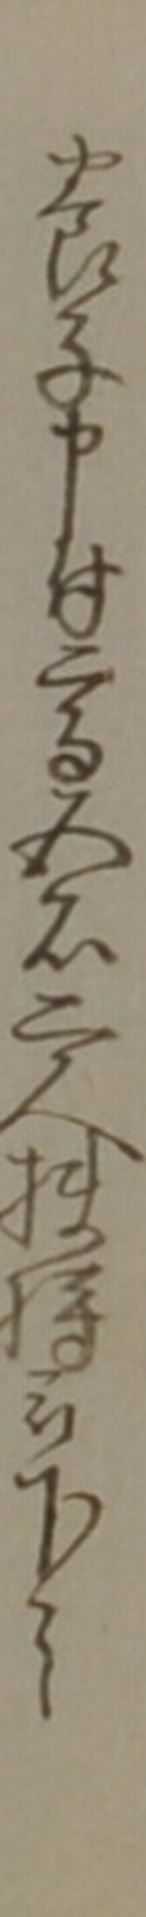養子申付高五石二人扶持被下之
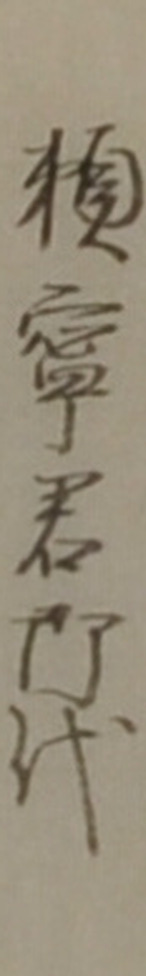頼寧君御代
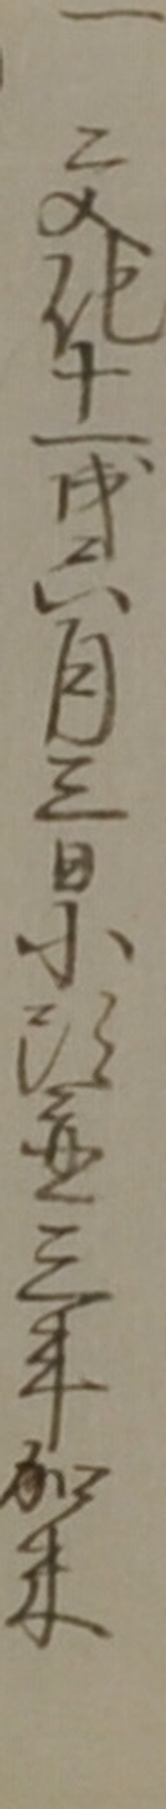一文化十一戌六月三日小頭並三斗加米
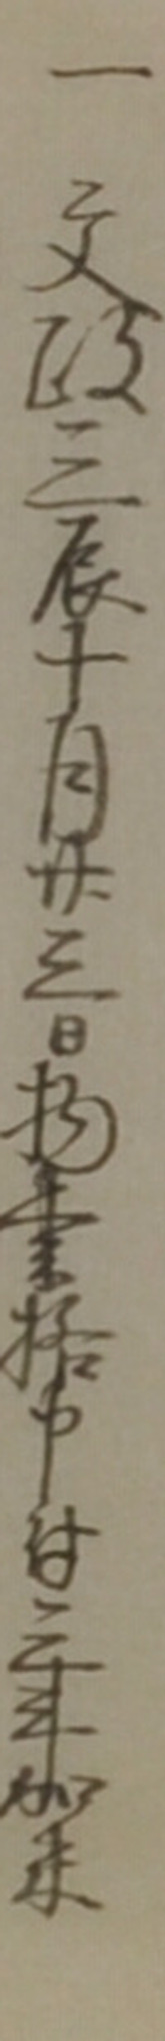一文政三辰十月廿三日物書格申付三斗加米
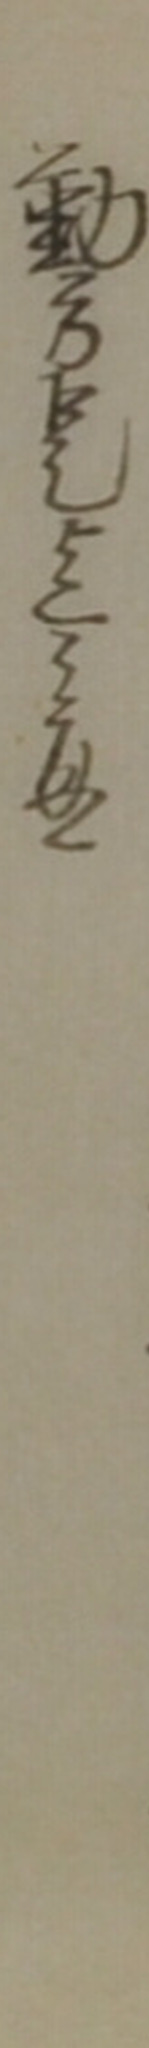勤方是迄之通
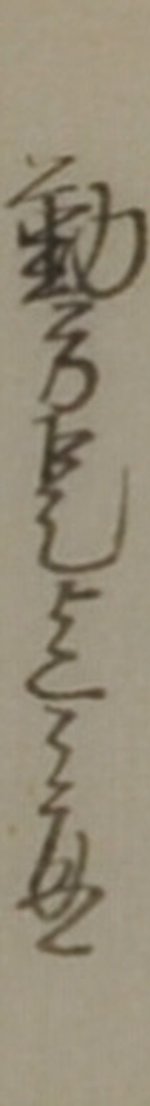勤方是迄之通
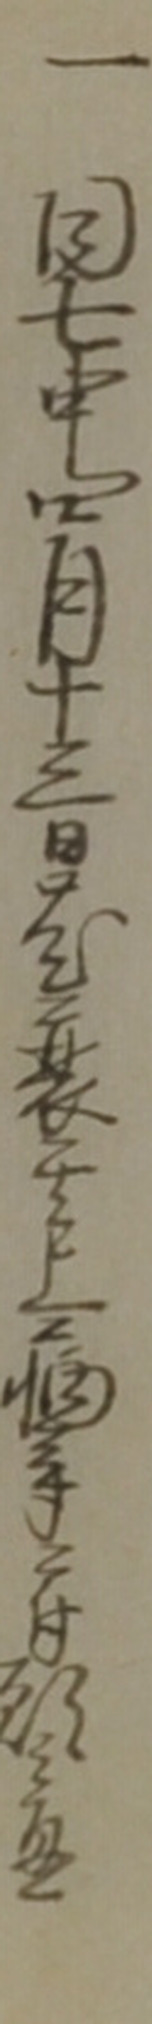一同七申四月十三日老衰其上病気ニ付願之通
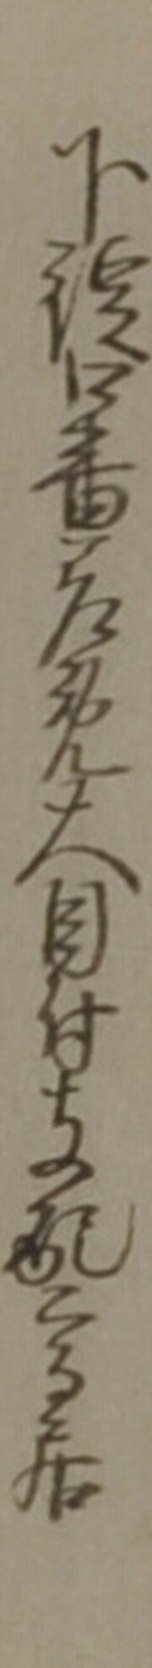下錠口番差免大目付支配高居
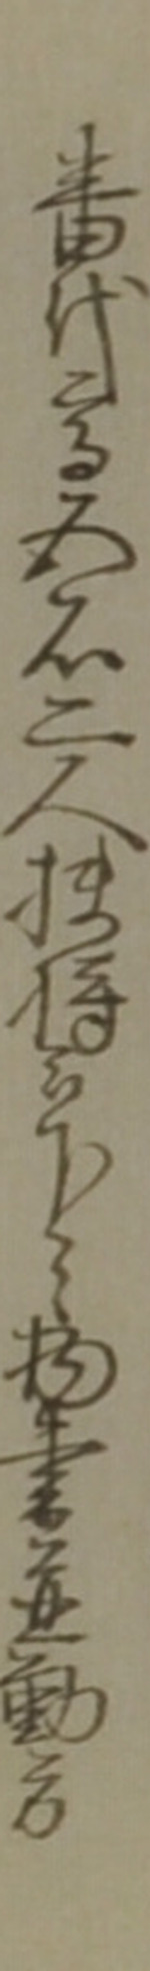番代高五石二人扶持被下之物書並勤方
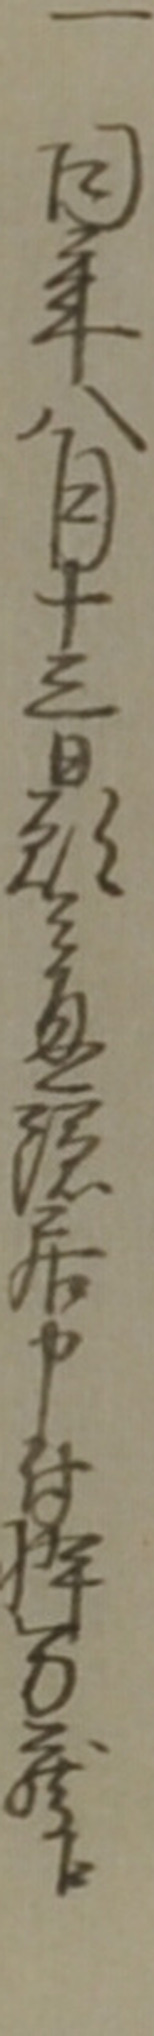一同年八月十三日願之通隠居申付忰万蔵江

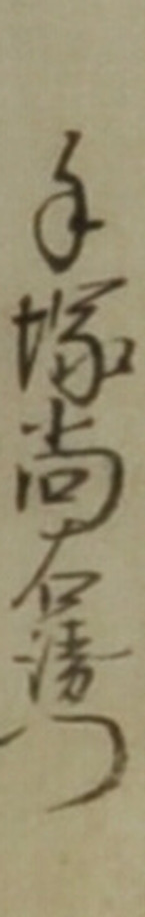手塚尚右衛門
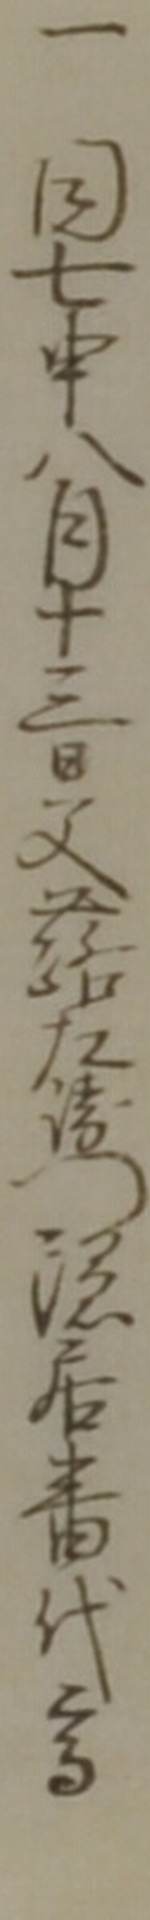一同七申八月十三日父蕗左衛門隠居番代高
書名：無足諸士勤仕録（七）
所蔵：伊那市立高遠町図書館・合同会社AMANE
